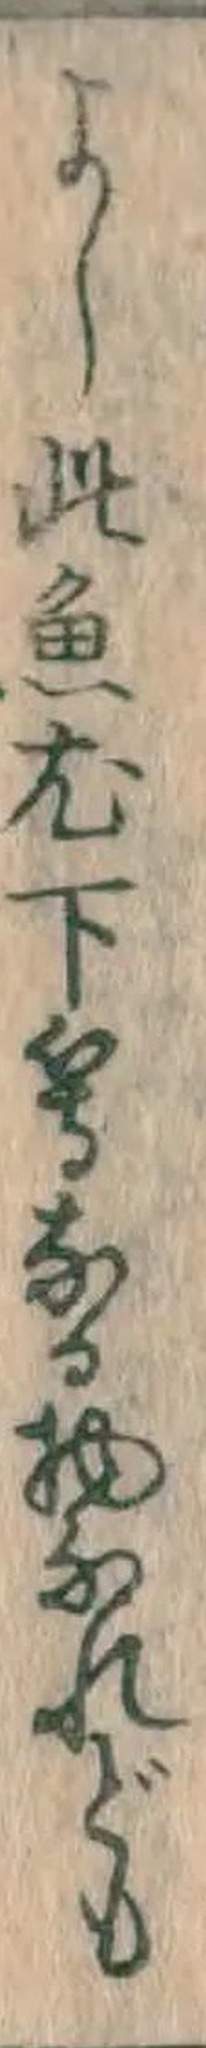よし此魚尤下等なる物なれども
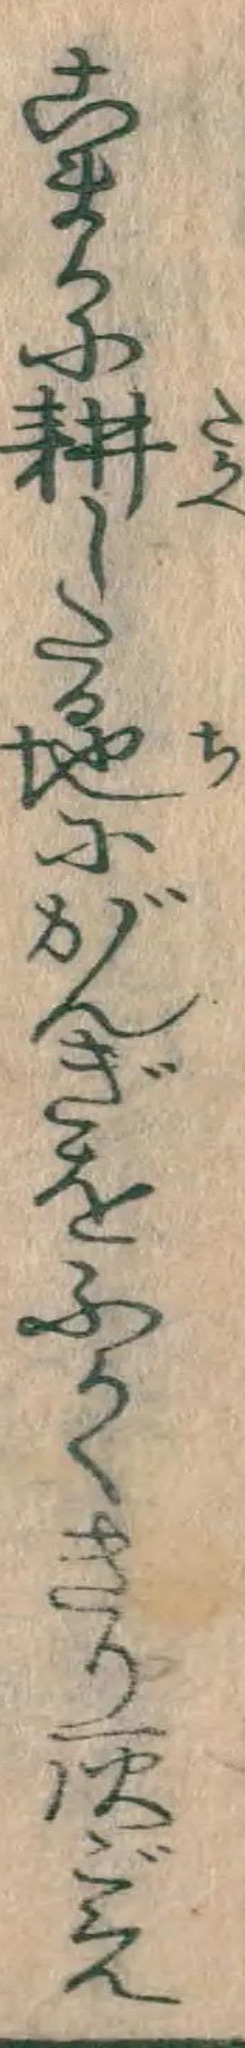こまかに耕したる地にがんぎをふかくきり灰ごえ
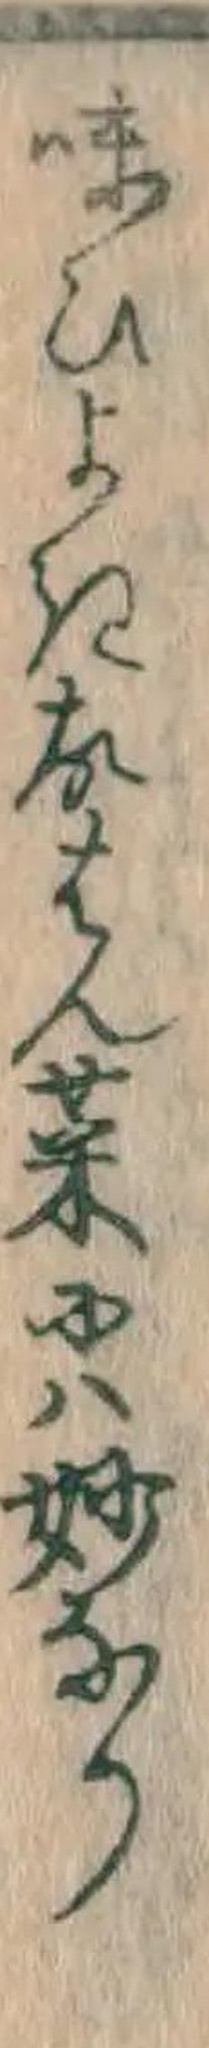味ひよき故はん菜には妙なり
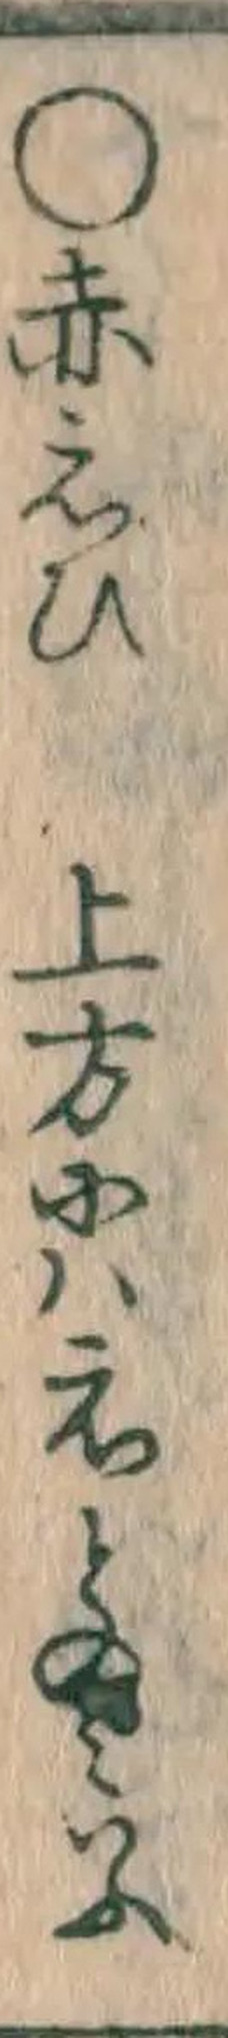○赤えひ上方にはえとのみいふ
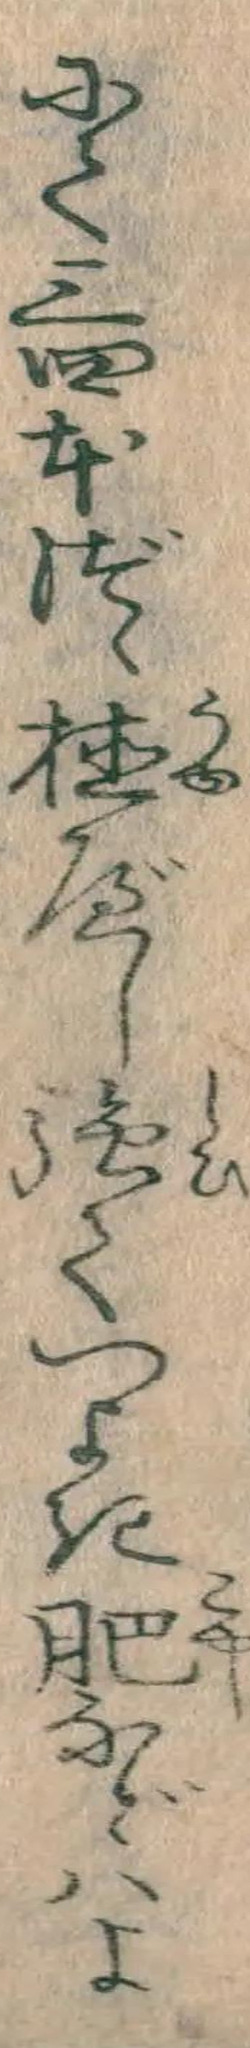にて三四本づゝ植べし強てつよき肥などはよ
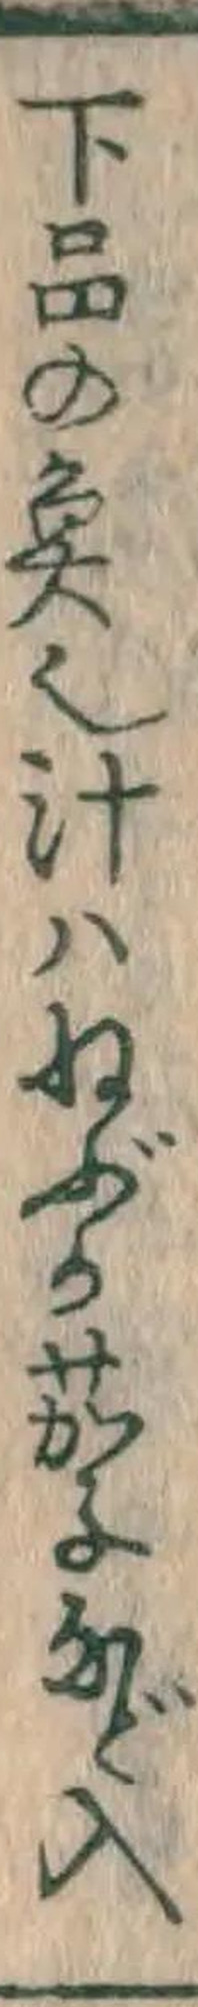下品の魚也汁はねぶか茄子など入
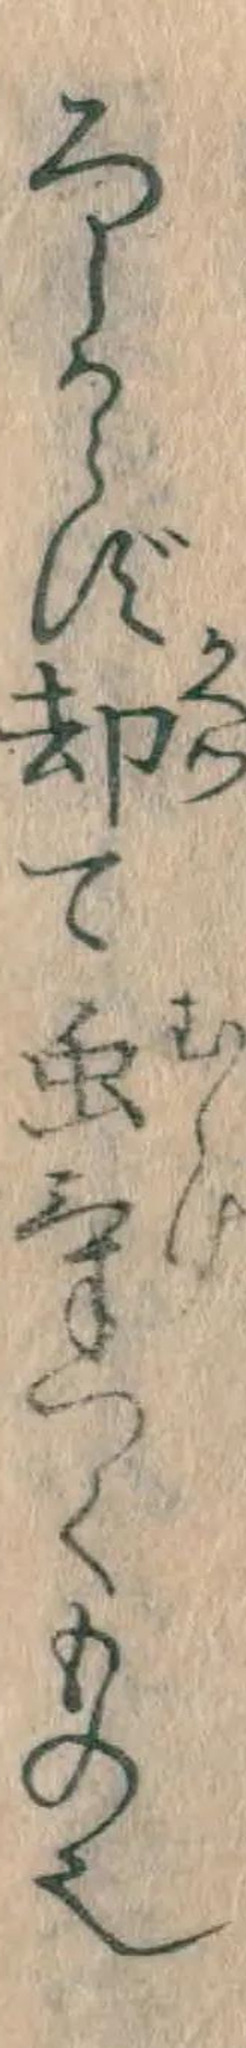ろしからず却て虫気つくもの也
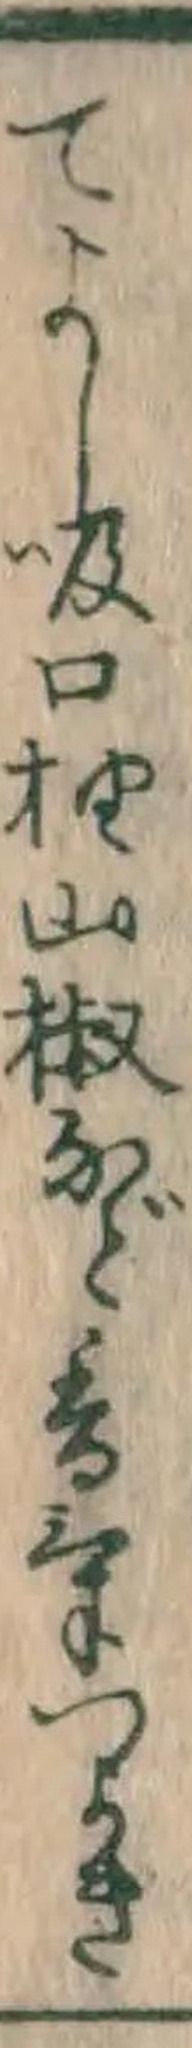てよし吸口柚山椒など香気つよき
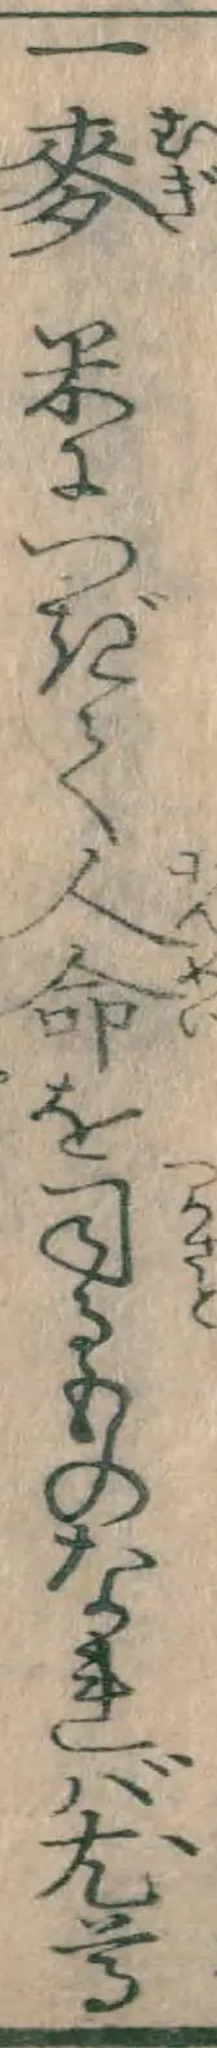一麦米につぎて人命を司るものなれば尤尊
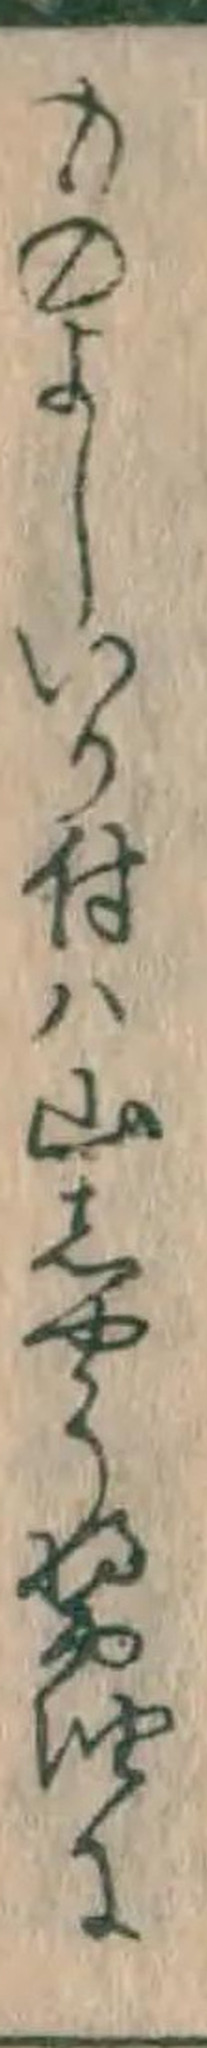ものよしいり付は山しやう醤油に
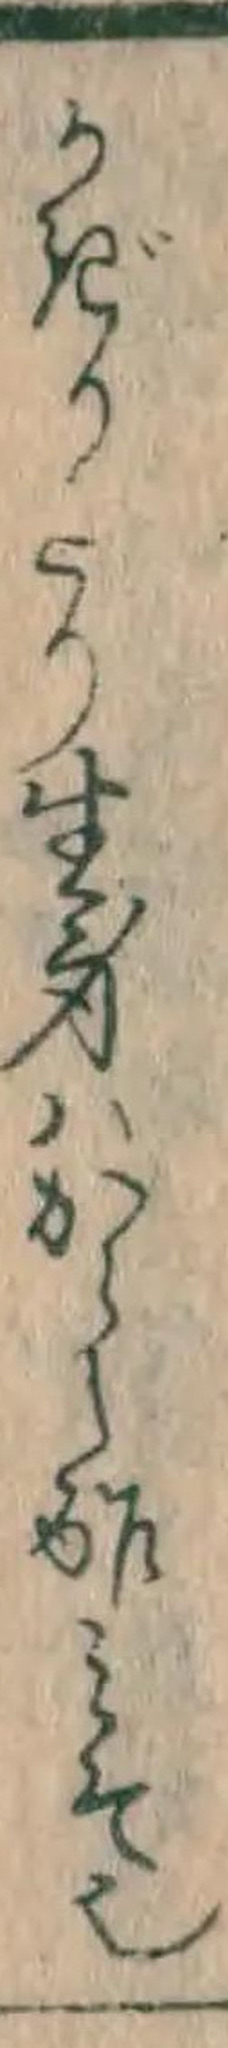かぎりたり生身はからし酢みそ也
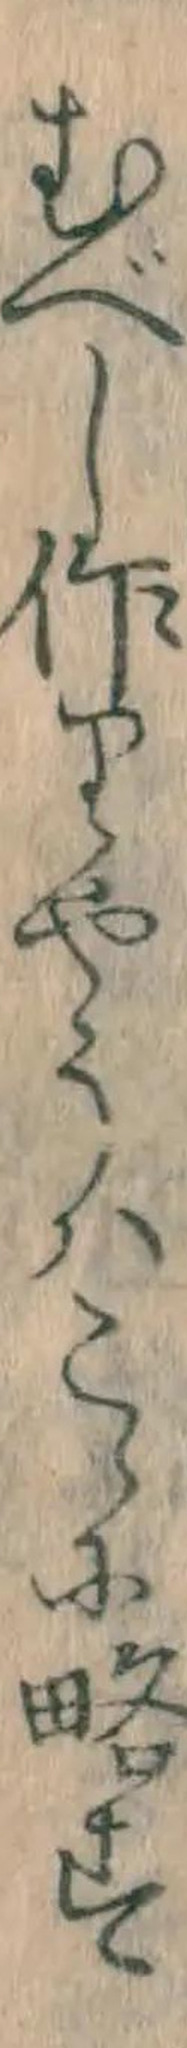むべし作りやうはこゝに略す

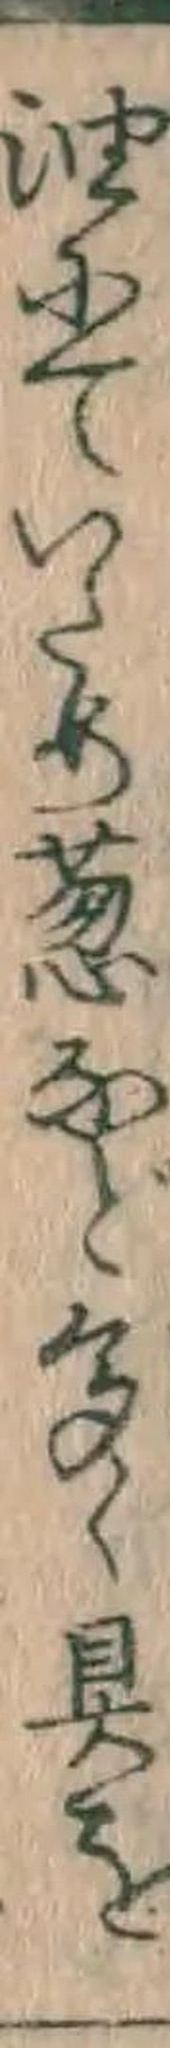油にていため葱など多く具を
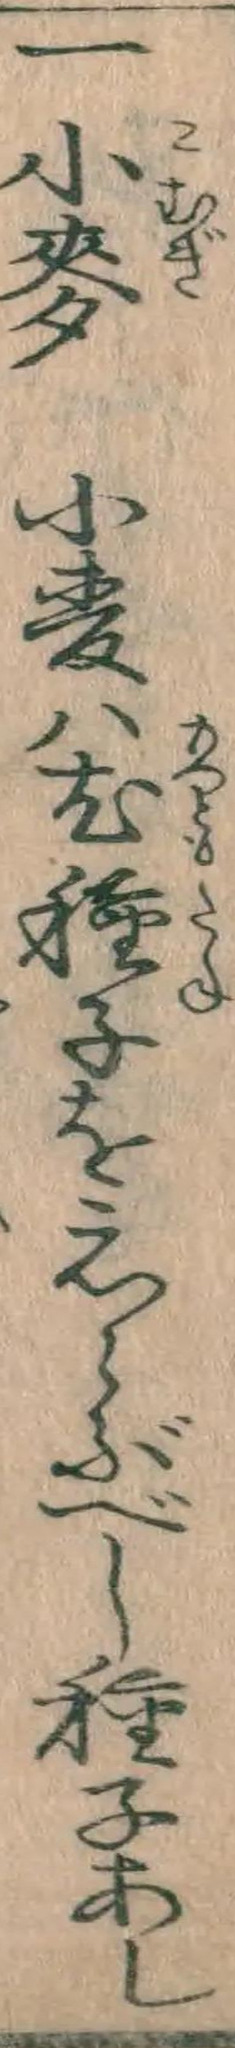一小麦小麦は尤種子をえらぶべし種子あし
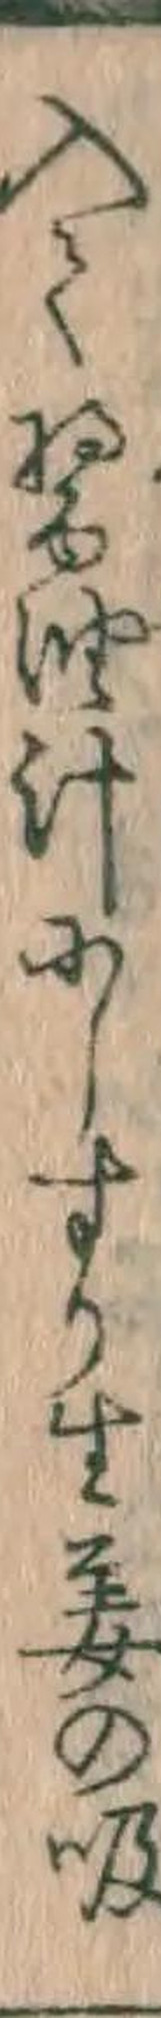入て醬油汁にしすり生姜の吸
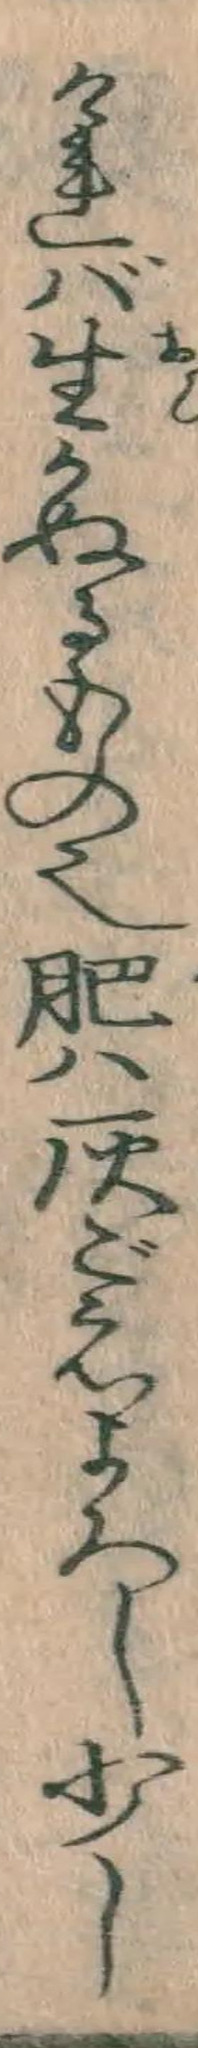ければ生かぬるもの也肥は灰ごえよろし少し
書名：広益秘事大全 3巻. [5]
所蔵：国立国会図書館 National Diet Library, JAPAN
